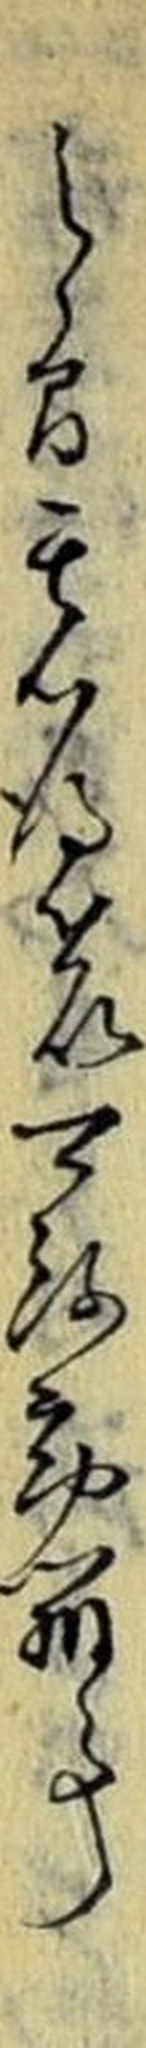之候間其心得を以可致勘弁事
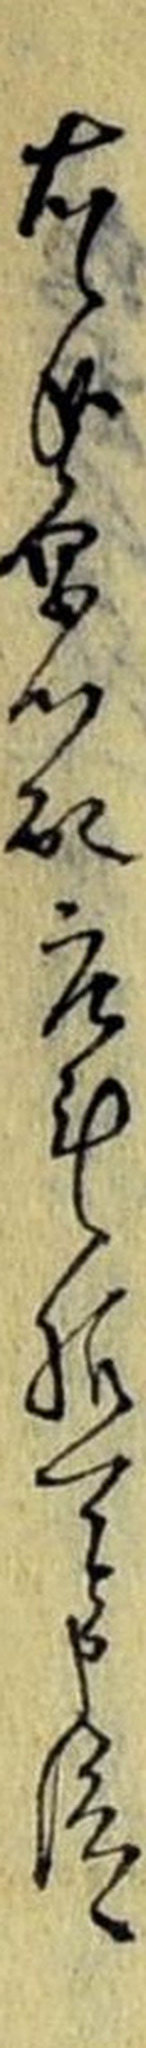右之趣厚心配取斗候様可被申渡候
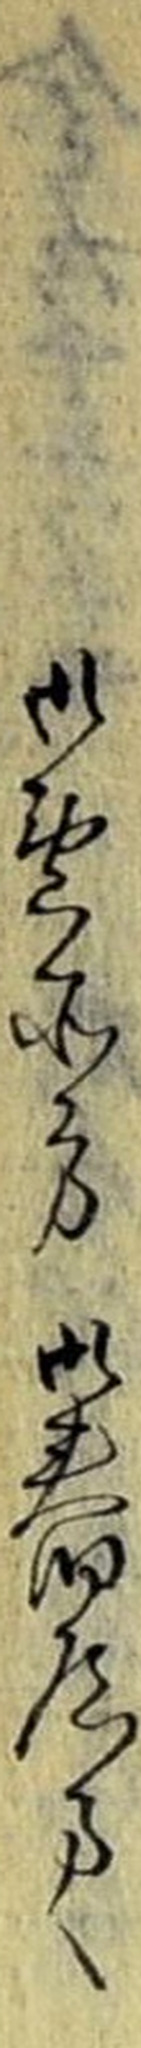御台所方御舂屋方へ
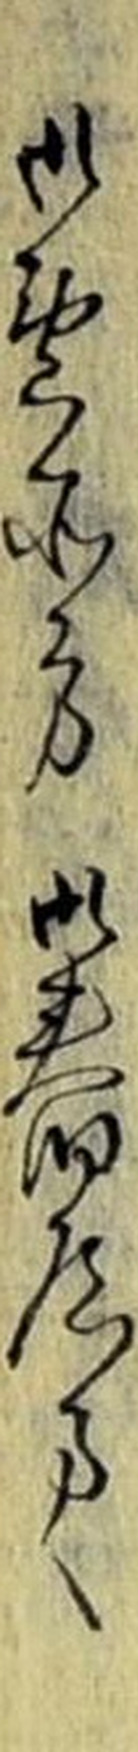御台所方御舂屋方へ
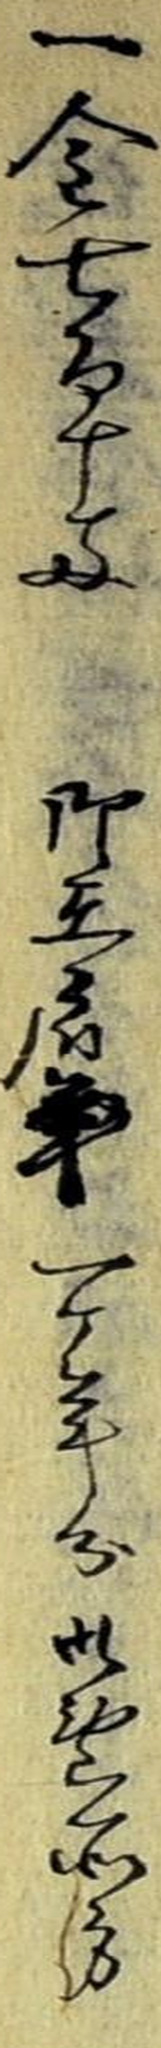一金七百十両御在府中一ヶ年分御台所方

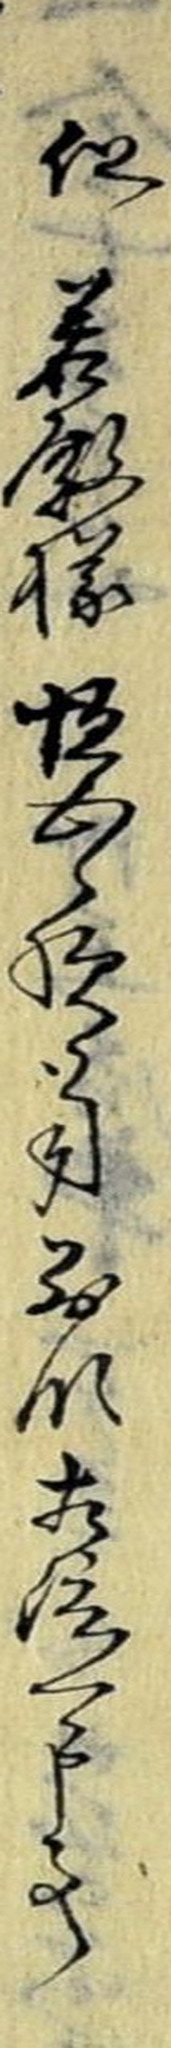但若殿様恒五郎様御用別段相渡可申事
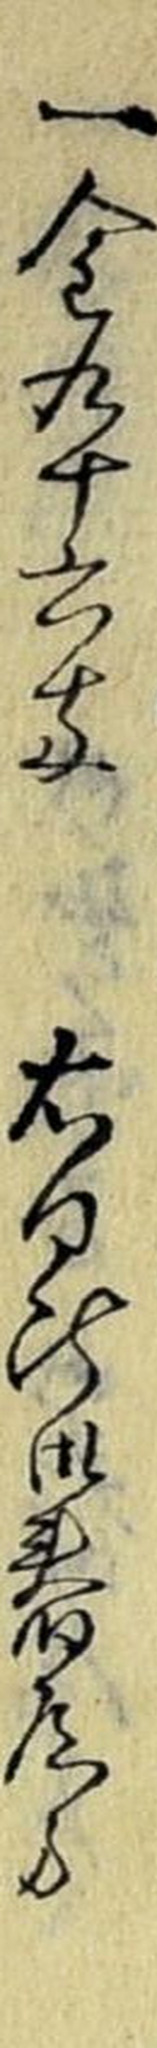一金九十六両右同断御舂屋方
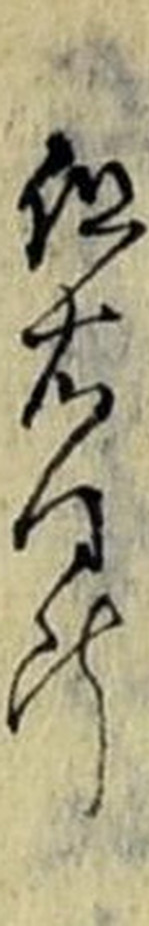但右同断
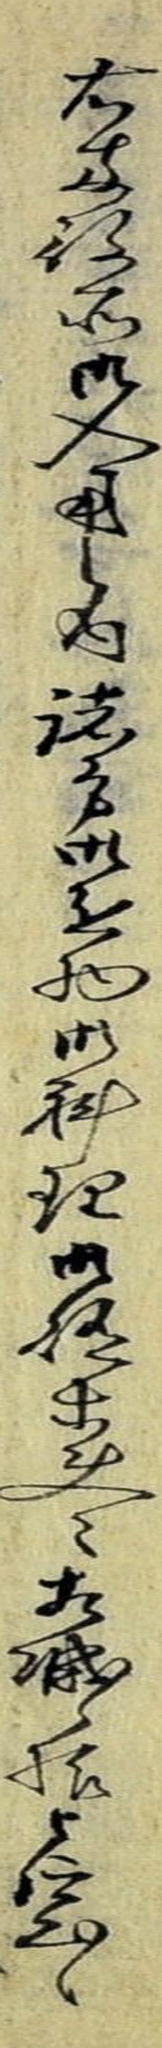右両役所御入用之内諸方御進物御料理御賄等夫々相減候様被仰出候
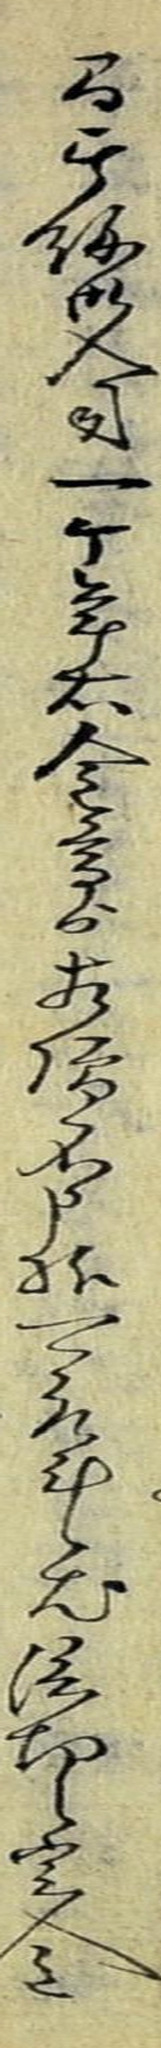間其餘御入用一ヶ年右金高ゟ相増不申様可取斗候尤渡切定金
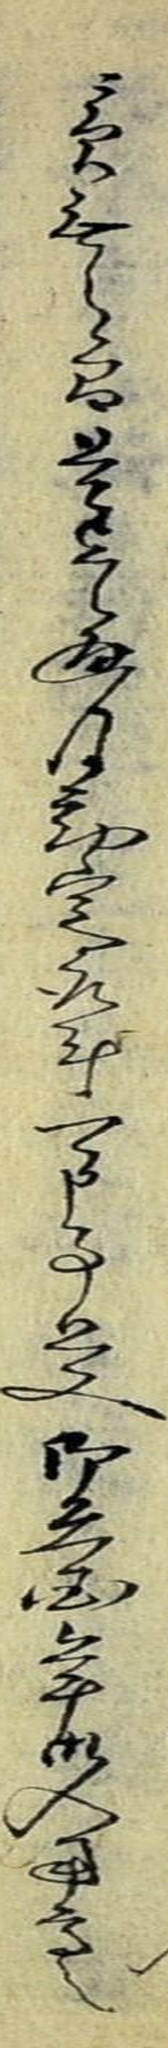に而は無之候間是迄之通月勘定取斗可申事且又御在国年御入用高之
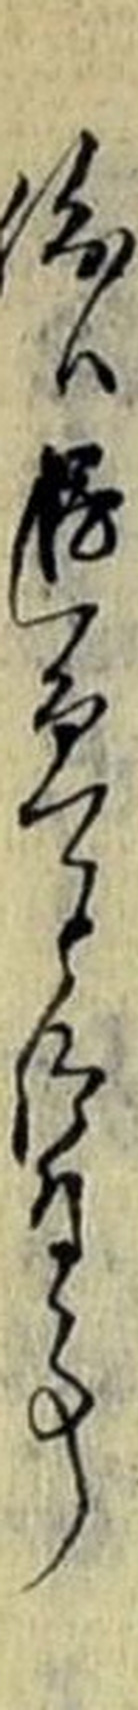儀は追而可被仰付事
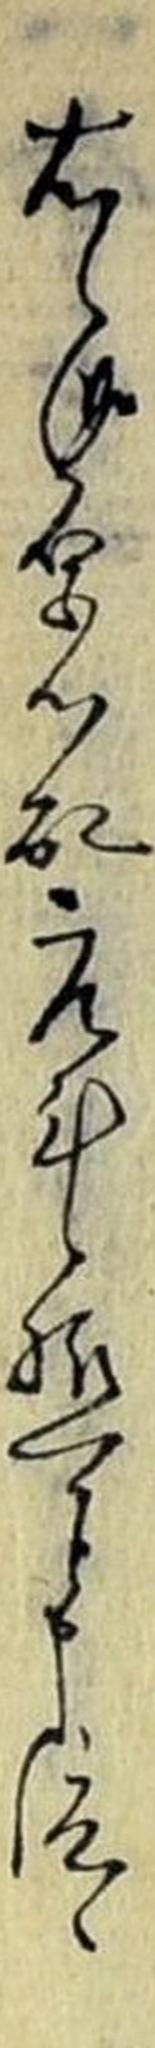右之趣厚心配取斗候様可被申渡候
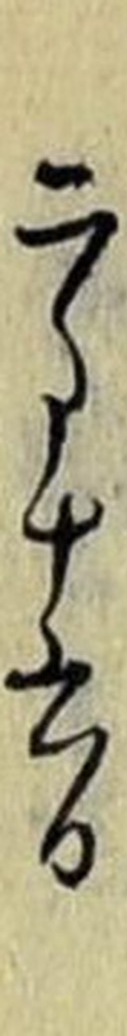二月十六日
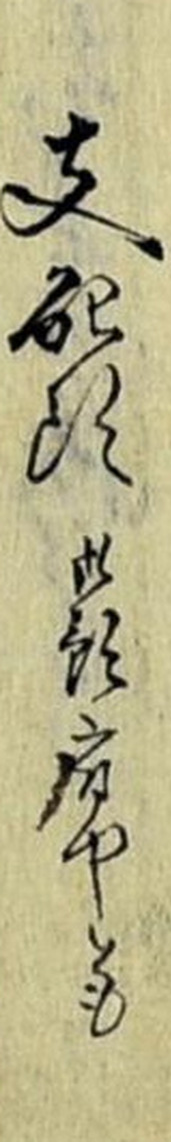支配頭御預府中とも
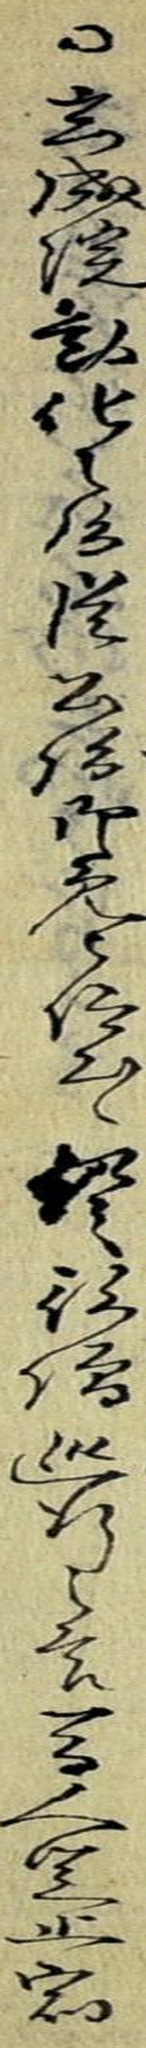○玄成院勧化之儀従公儀御免被仰出候仍之役僧巡行之節馬人足止宿
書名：命令之部 四
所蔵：福井県文書館 Fukui Prefectural Archives
